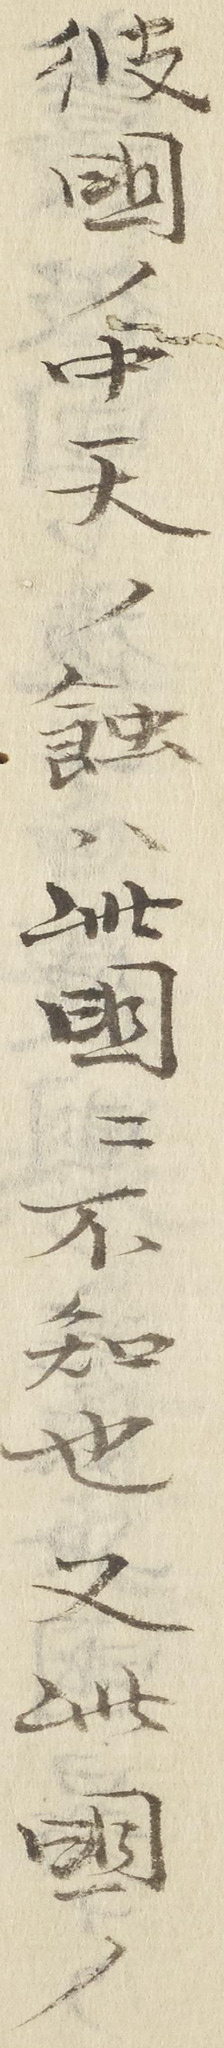彼国ノ中天ノ蝕ハ此国ニ不知也又此国ノ

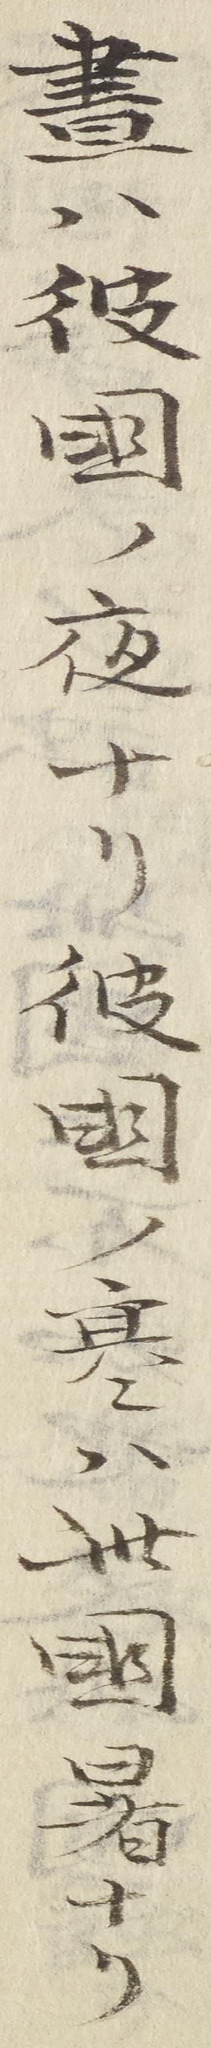昼ハ彼国ノ夜ナリ彼国ノ寒ハ此国暑ナリ
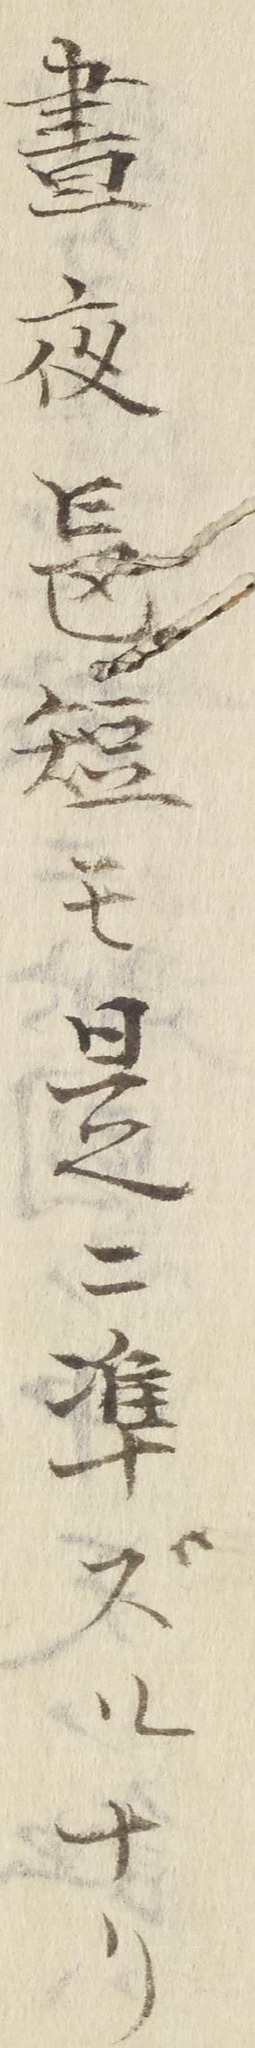昼夜長短モ是ニ準ズルナリ
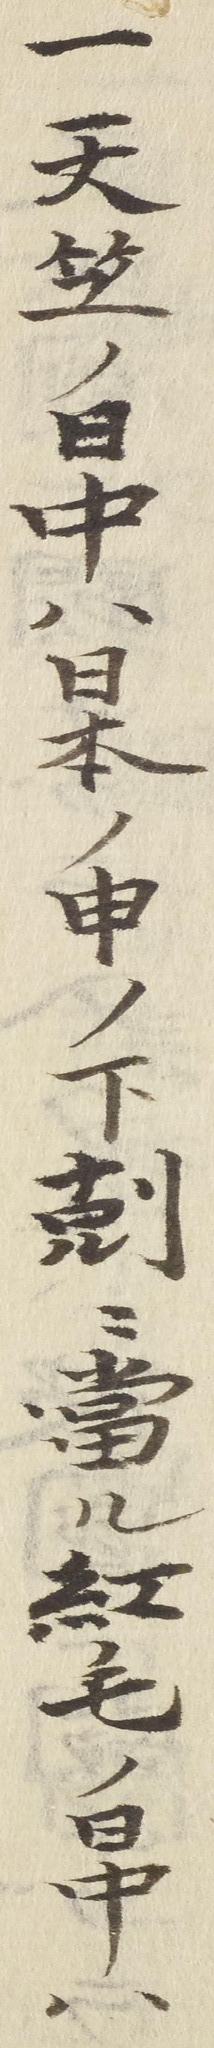一天竺ノ日中ハ日本ノ申ノ下剋ニ当ル紅毛ノ日中ハ
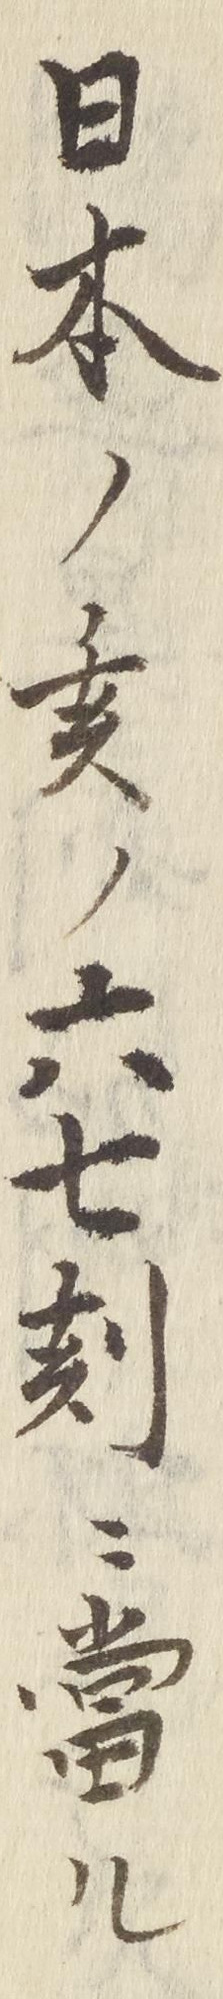日本ノ亥ノ六七刻ニ当ル
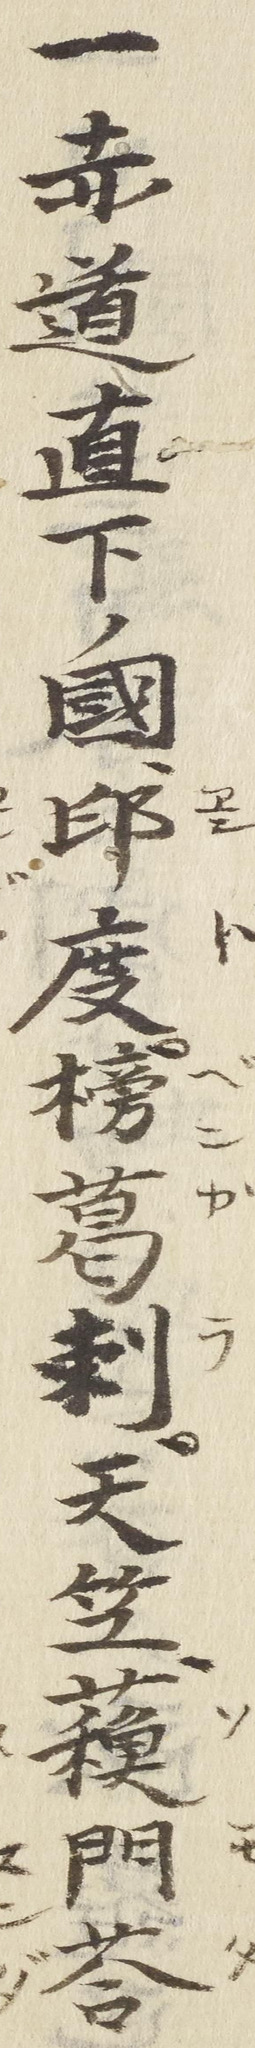一赤道直下ノ国、印度。榜葛刺。天竺、蘓門荅
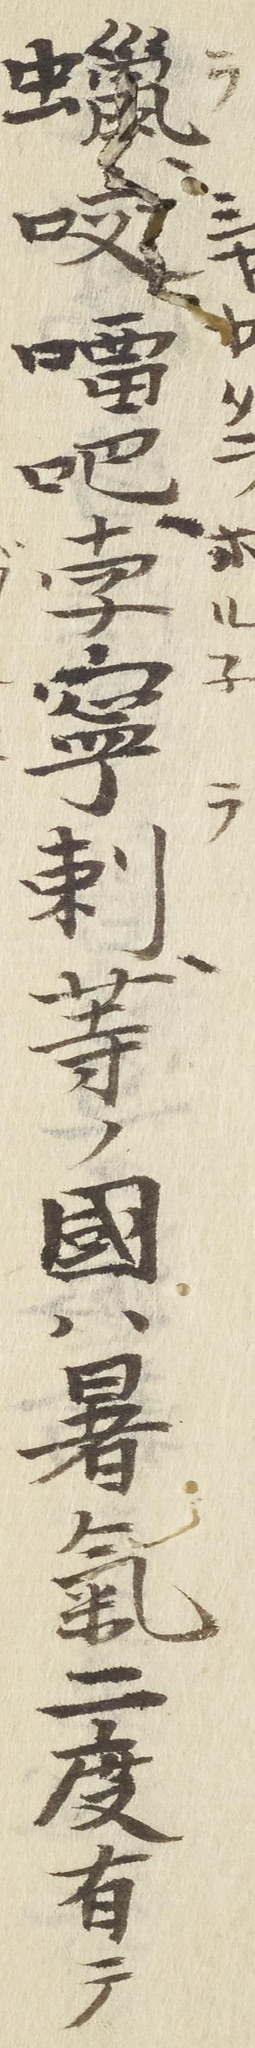蝋、咬𠺕吧、孛寧刺、等ノ国ハ暑気二度有テ
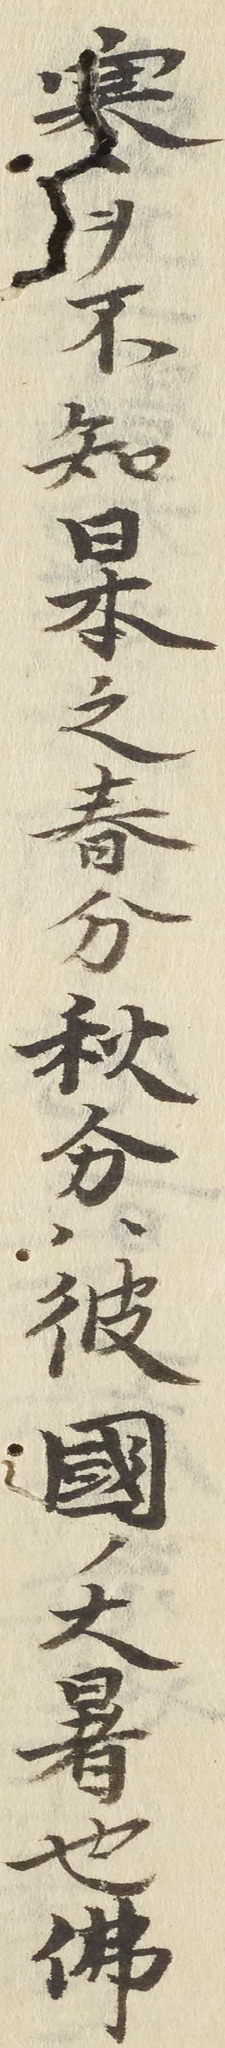寒ヲ不知日本之春分秋分ハ彼国ノ大暑也仏
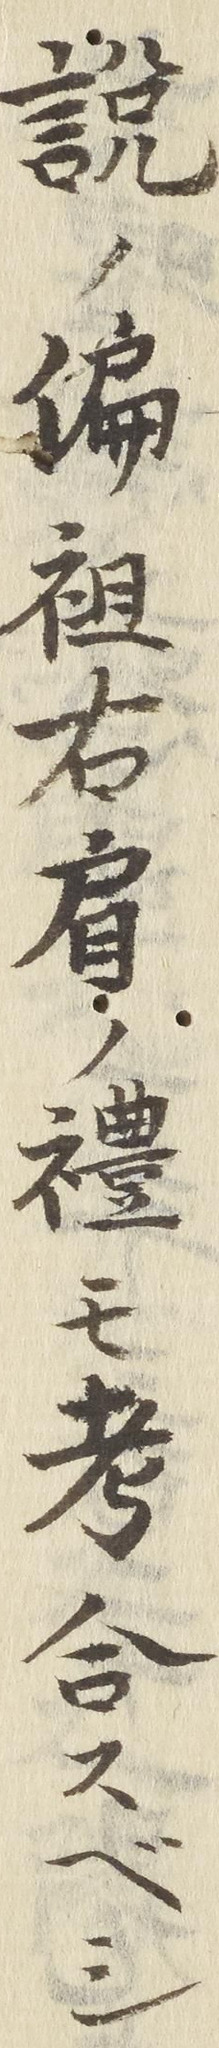説ノ偏祖右肩ノ礼モ考合スベシ
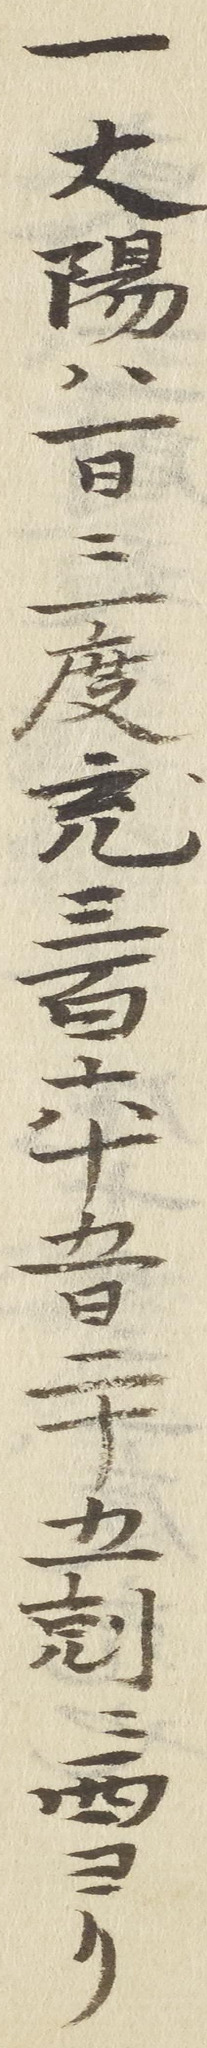一大陽ハ一日ニ三度充三百六十五日二十五剋ニ西ヨリ
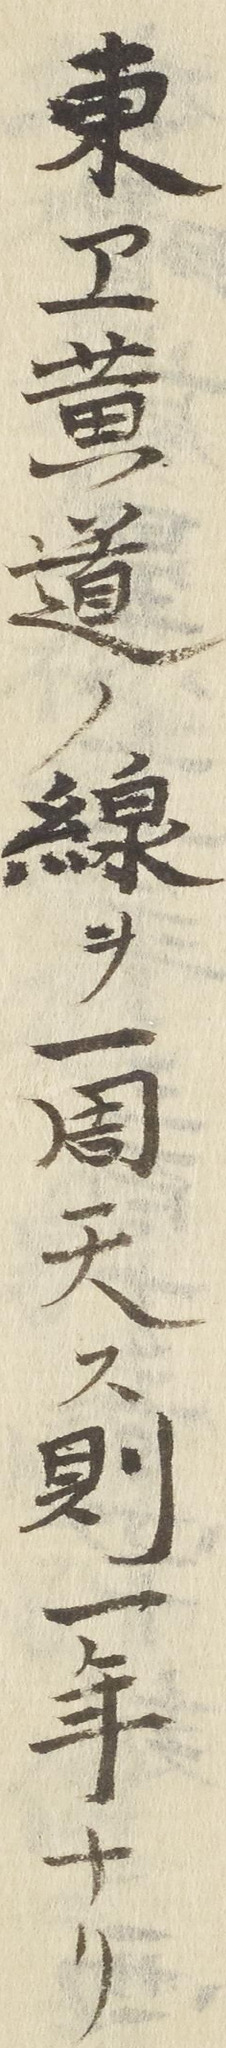東ヱ黄道ノ線ヲ一周天ス則一年ナリ
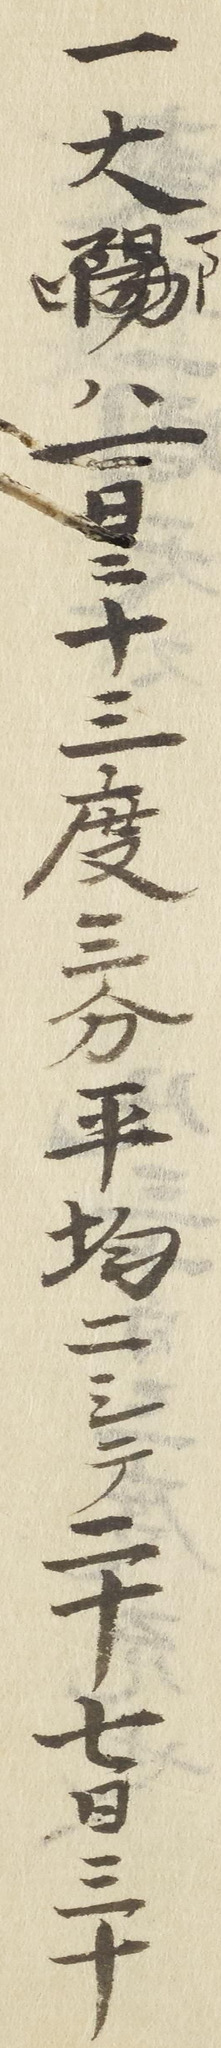一大陽は一日ニ十三度三分平均ニシテ二十七日三十
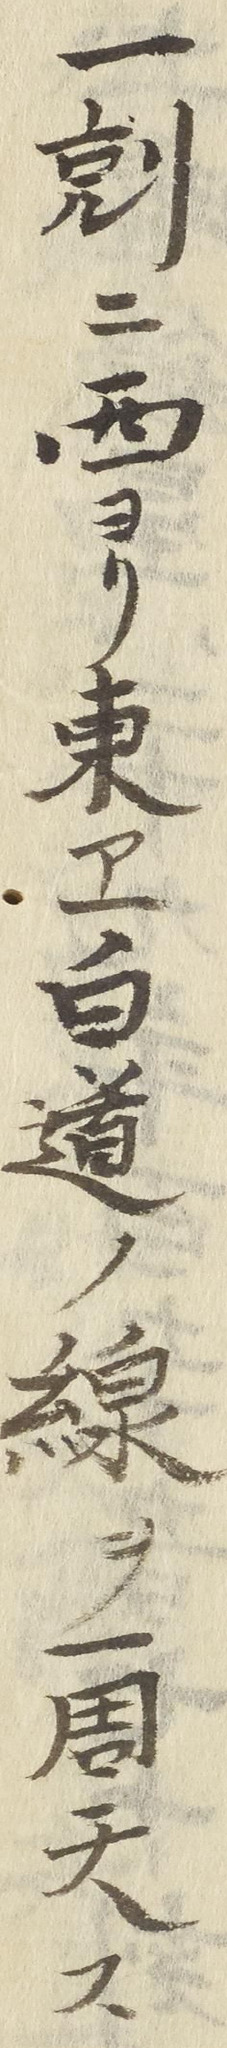一剋ニ西ヨリ東ヱ白道ノ線ヲ一周天ス

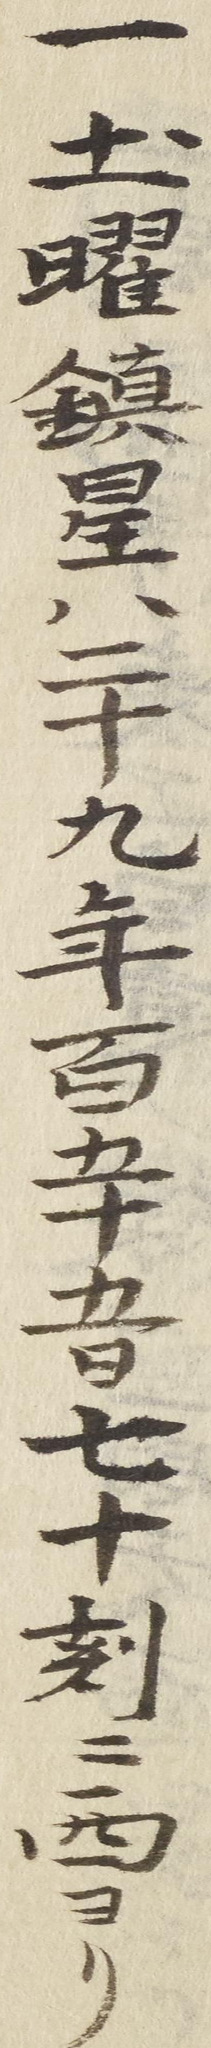一土曜鎮星ハ二十九年百五十五日七十刻ニ西ヨリ
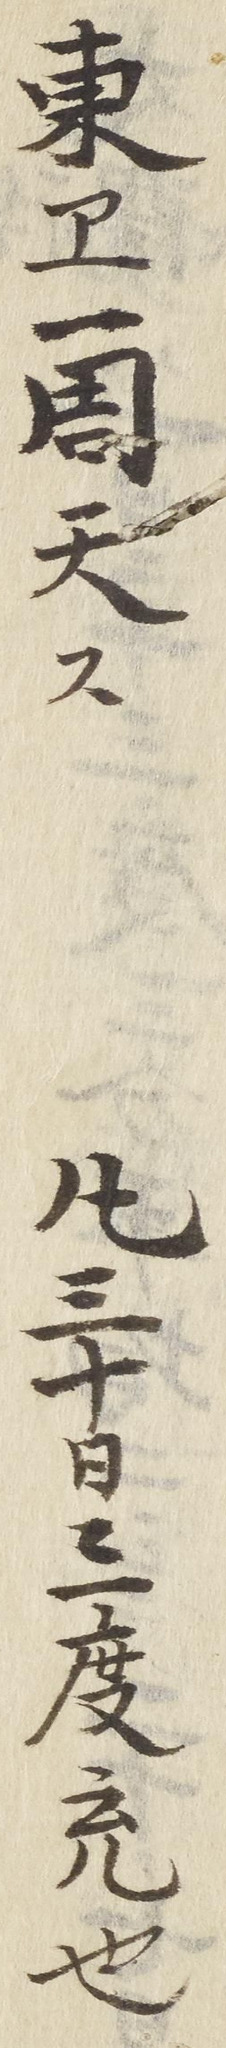東ヱ一周天ス凡三十日三度充也
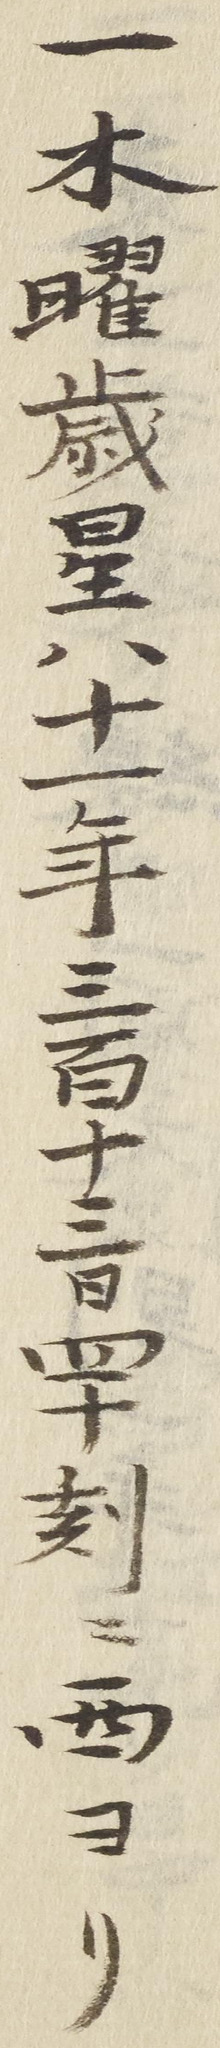一木曜歳星ハ十一年三百十三日四十刻ニ西ヨリ
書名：天象話説
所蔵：東京大学地震研究所図書室 Earthquake Research Institute Library, The University of Tokyo, JAPAN
